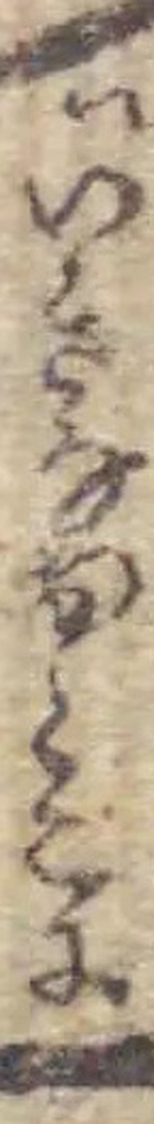〽いきなおとこに
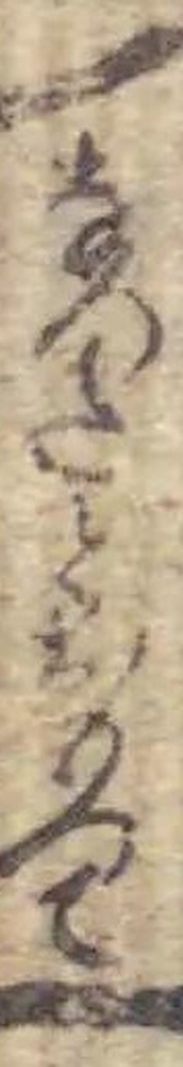なつたとおもつて
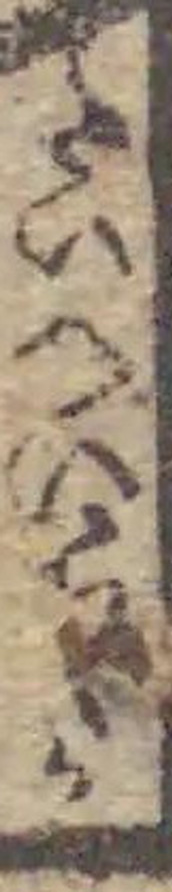たいへいらくか

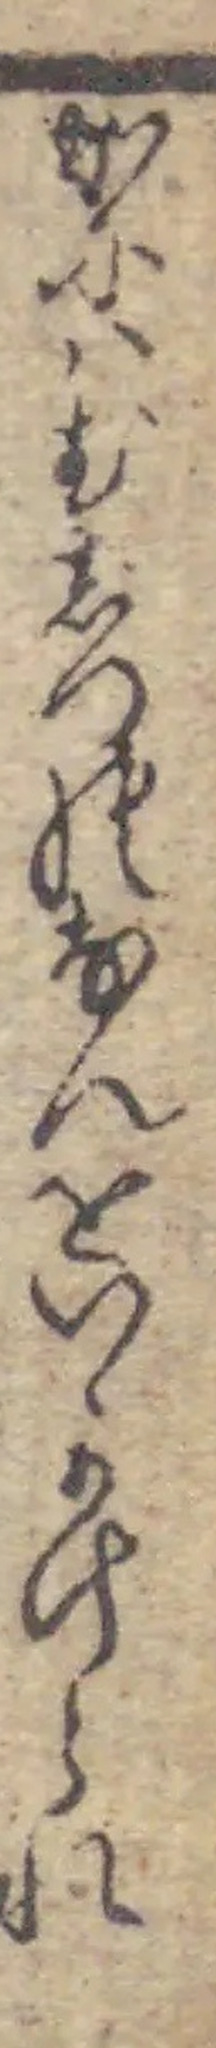かにはむじつのなんをいゝかけられ
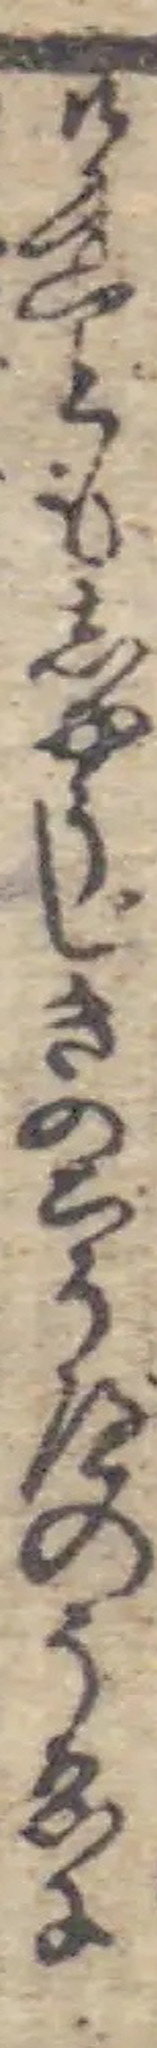けれどもしやうじきのこうべのうゑに
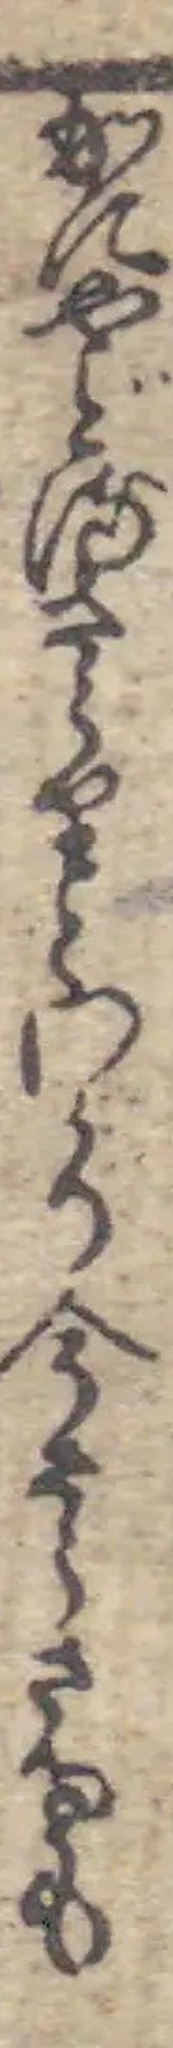かにやどるさらりとわかり今さらさるも
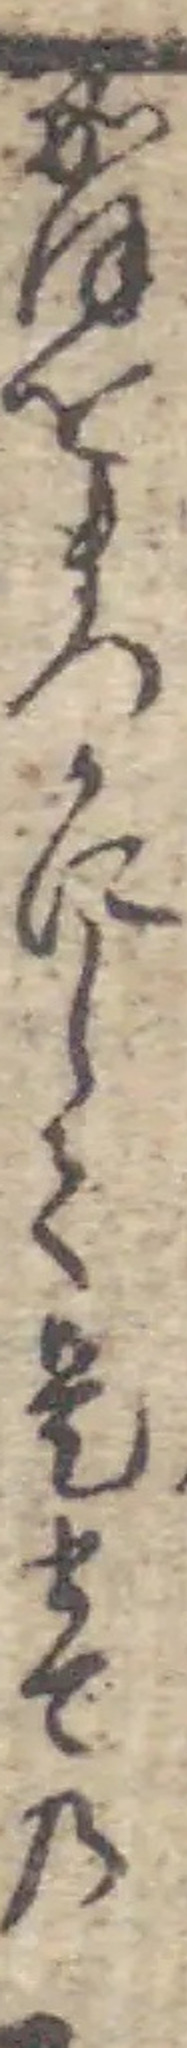かほをまつかにして是まての
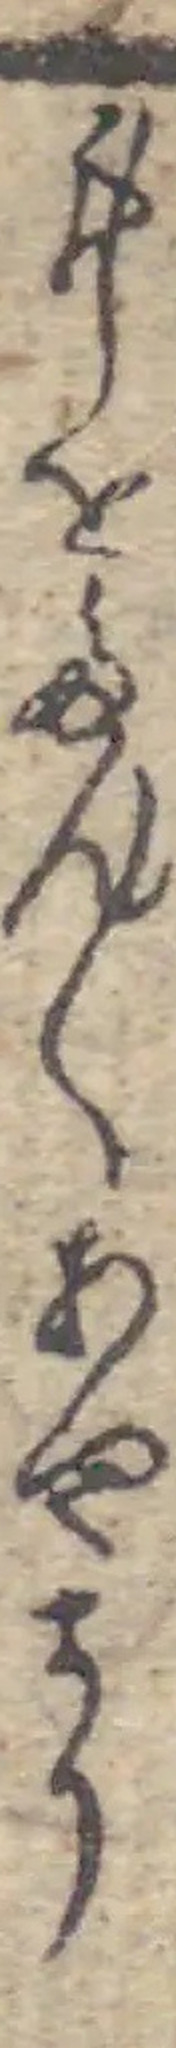事をたん〳〵あやまり
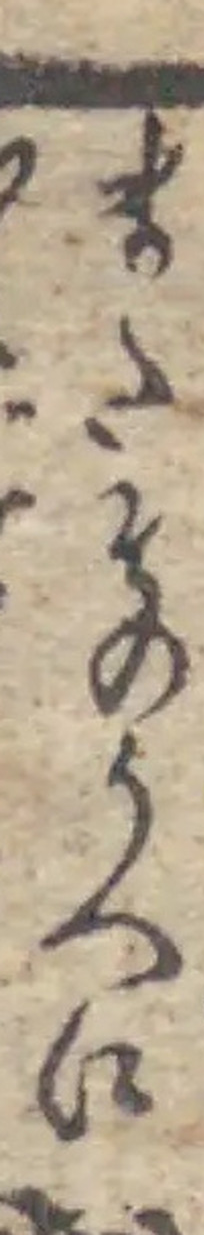またそのうへに
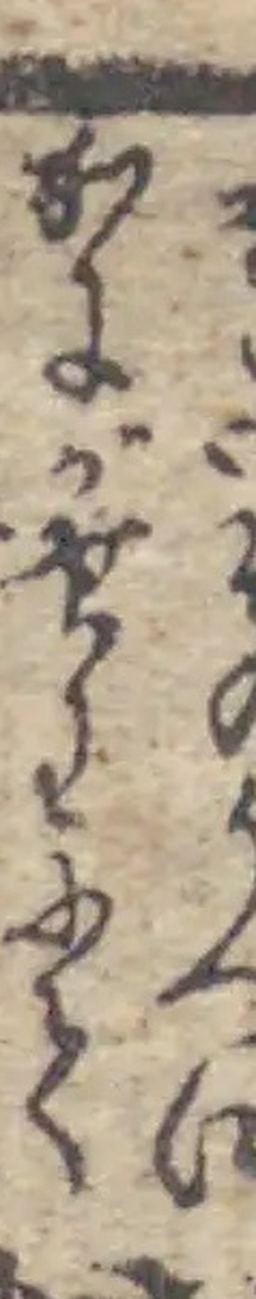かにがせわにて
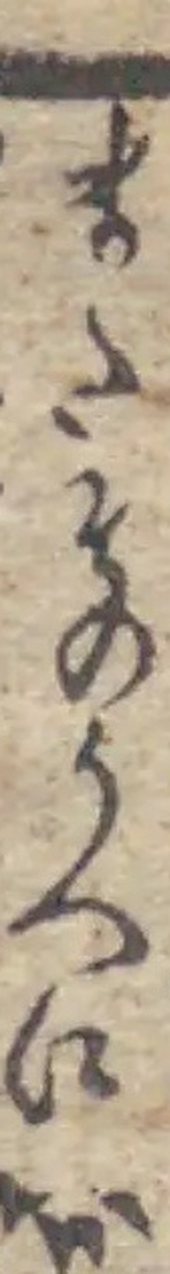またそのうへに
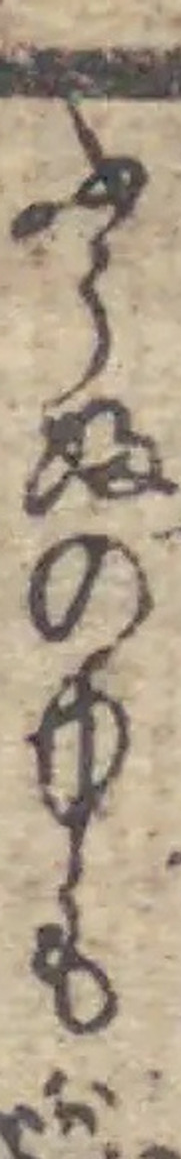ふうふの中も
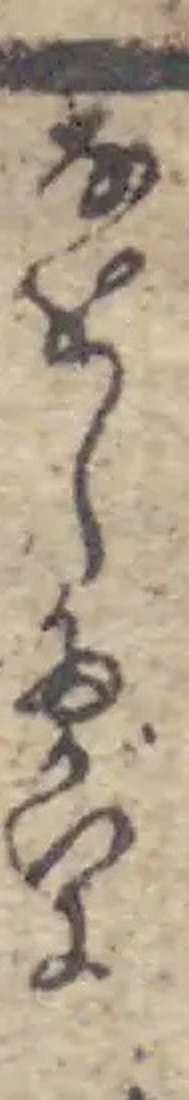なをしたがいに
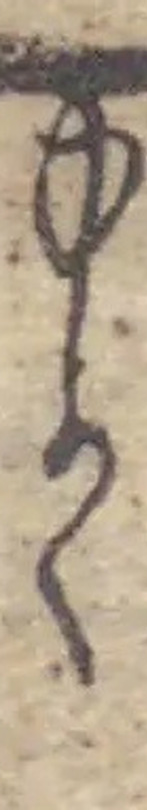中よく
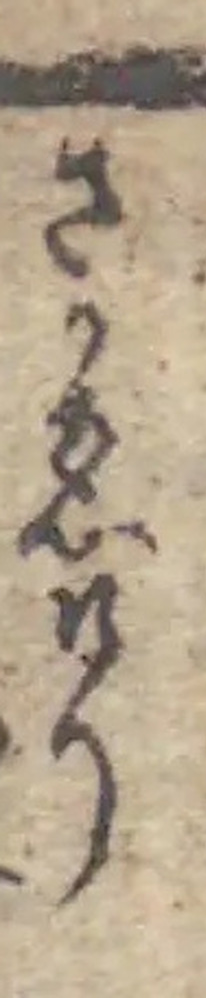さかゑけり
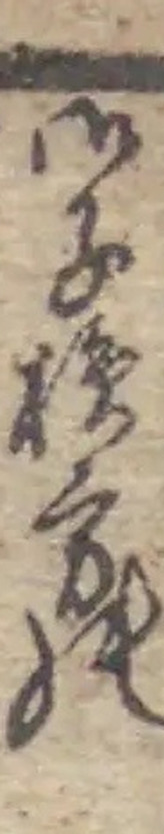御子様方の
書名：蟹牛房挟多 3巻
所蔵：国立国会図書館 National Diet Library, JAPAN
